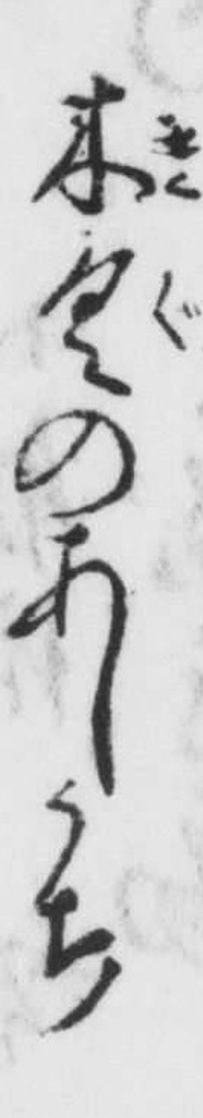へき木のあしうち
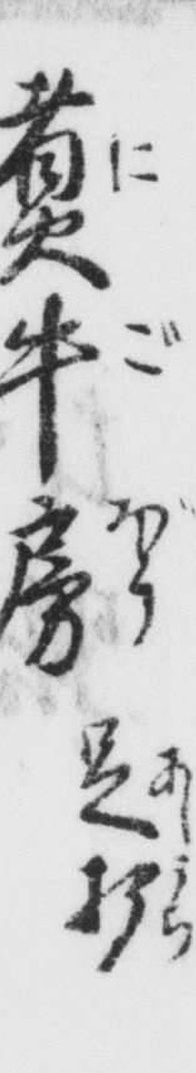煮午房足打
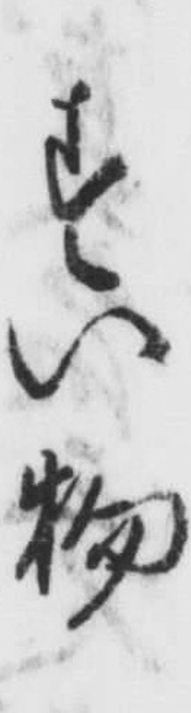すい物
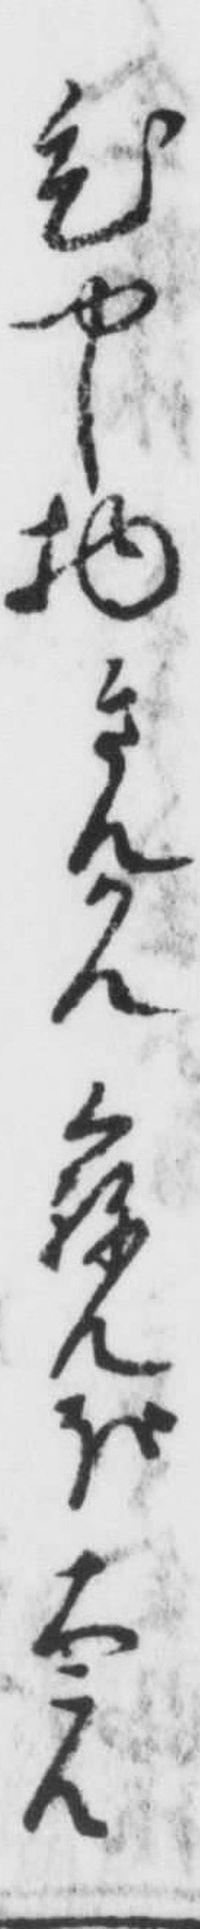ひやし物きんかんくねんぼ大こん
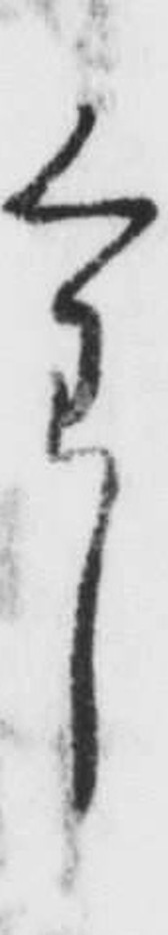くわし
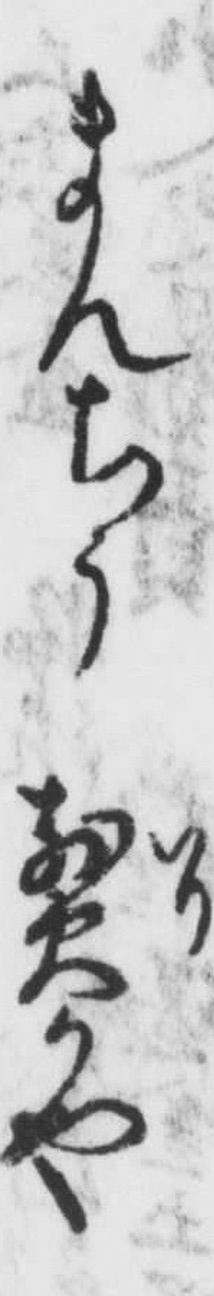まんちう煎かや
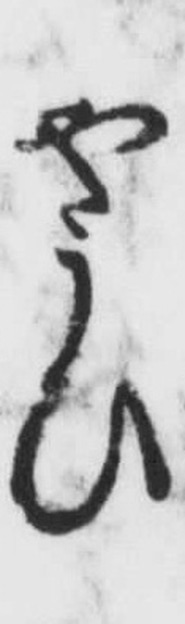やうひ

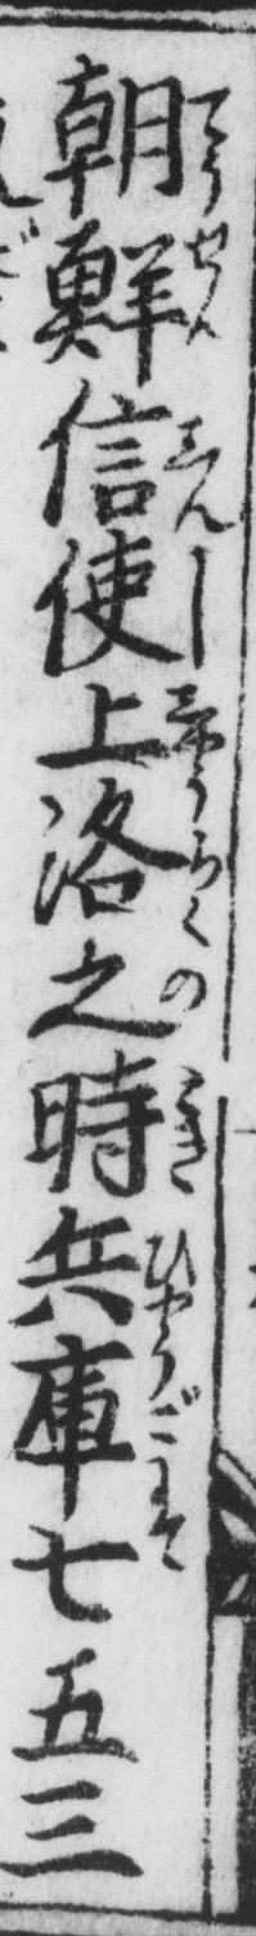朝鮮信使上洛之時兵庫七五三
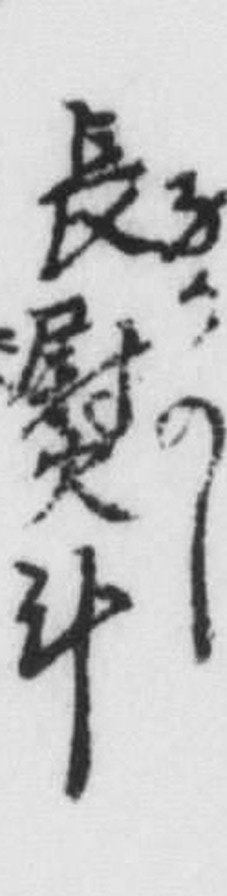長熨斗
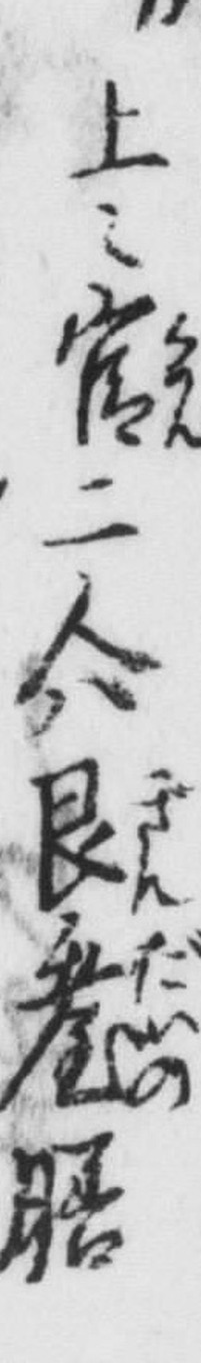上々官二人ハ艮臺膳
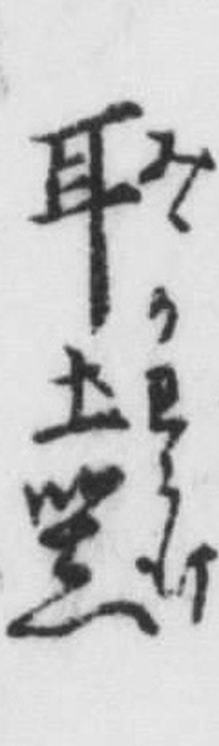耳土器
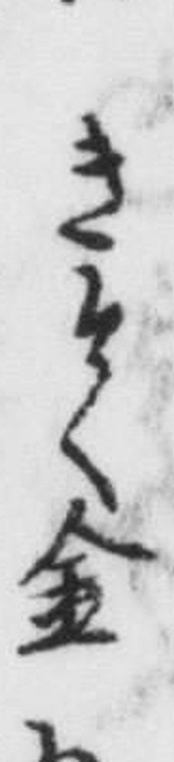きそく金
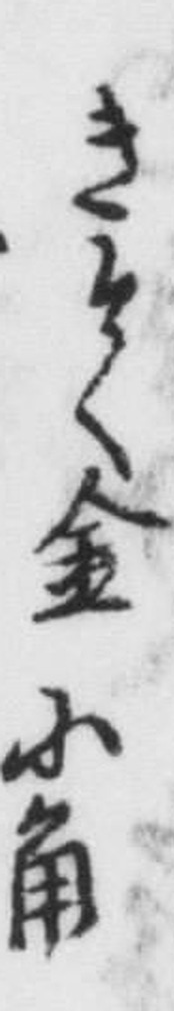きそく金羊
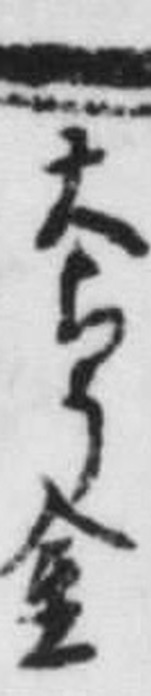大ちう金
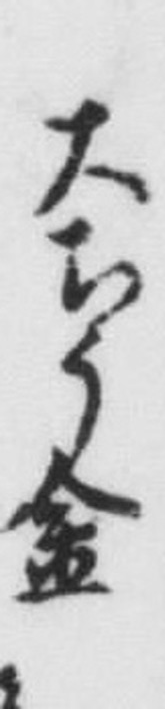大ちう金
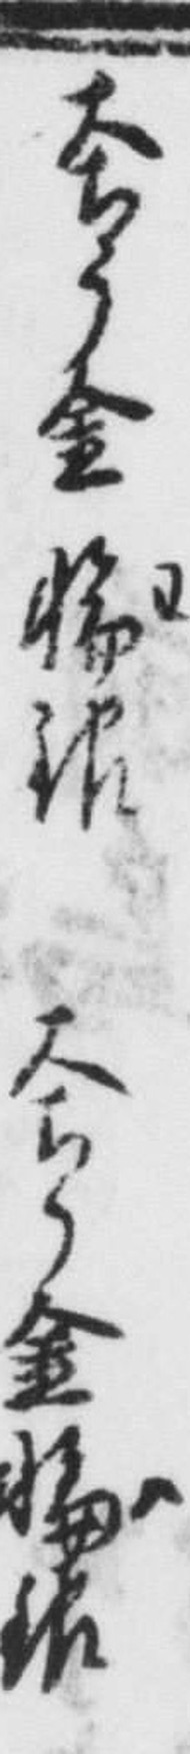大ちう金輪銀大ちう金輪銀
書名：料理切形秘伝抄
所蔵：大阪府立大学学術情報センター 国文学研究資料館
